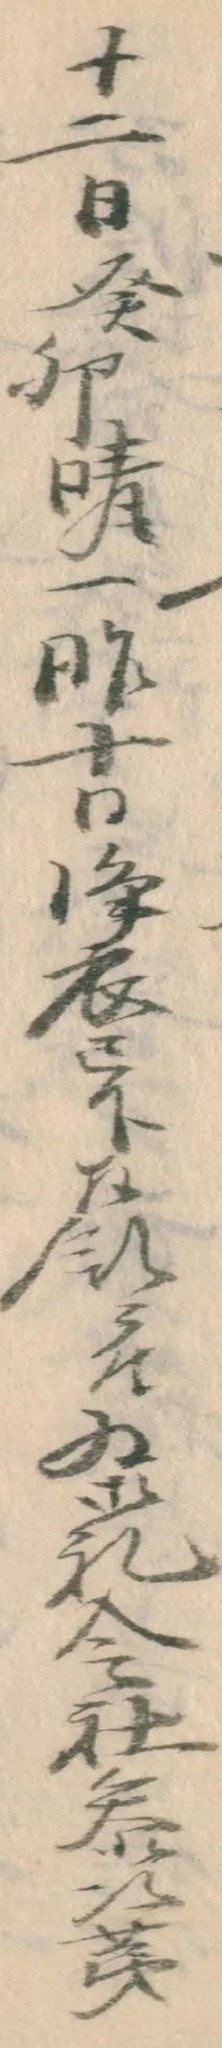十二日癸卯晴一昨十日浄衣已下拝領ニ付為御礼令社参次第
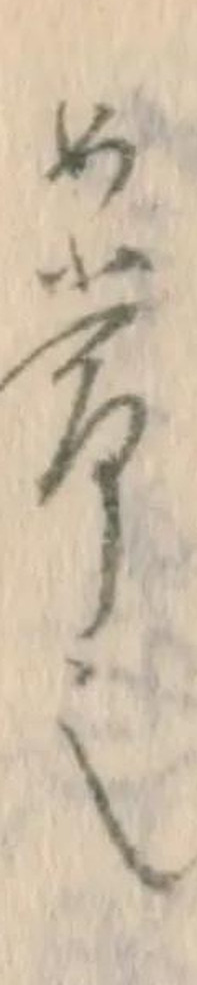如常也
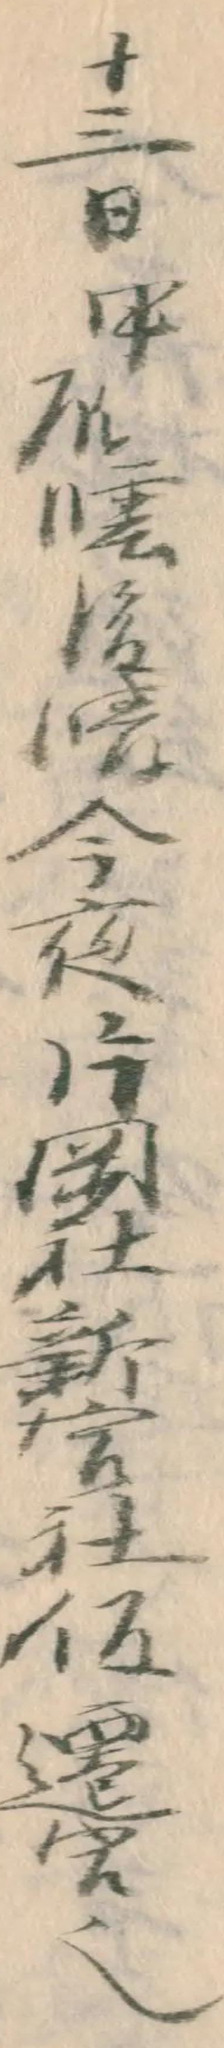十三日甲辰曇後暁今夜片岡社新宮社仮遷宮也
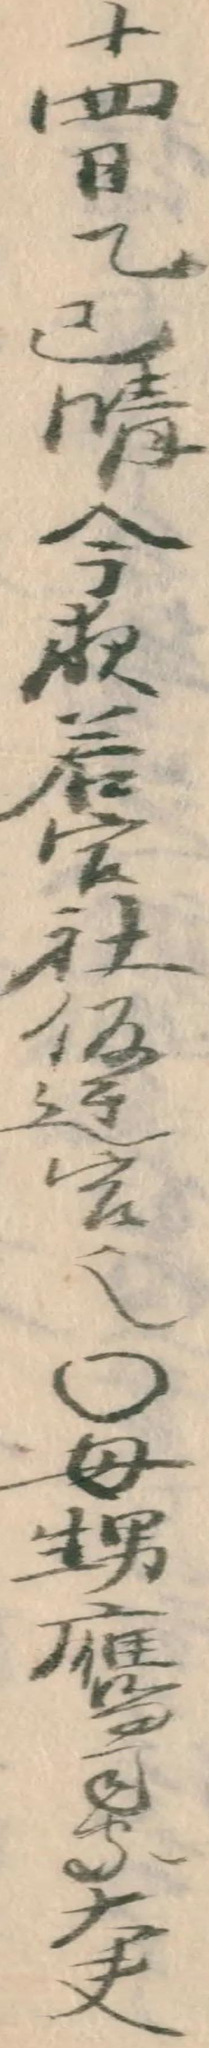十四日乙巳晴今夜若宮社仮遷宮也○母甥鷹司家大夫
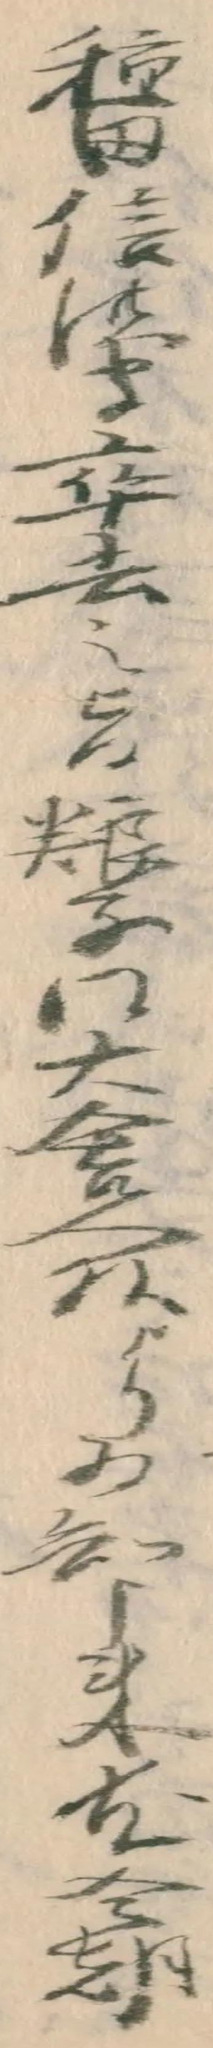種田信濃守卒去之旨養子同大舎人頭より為知申来尤今朝
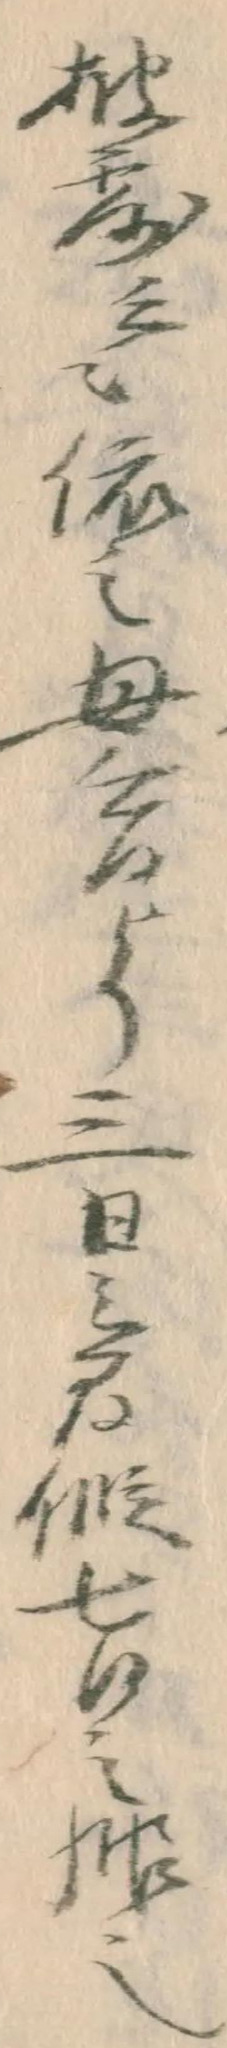披露云々依之母今日より三日之間仮七日之服也
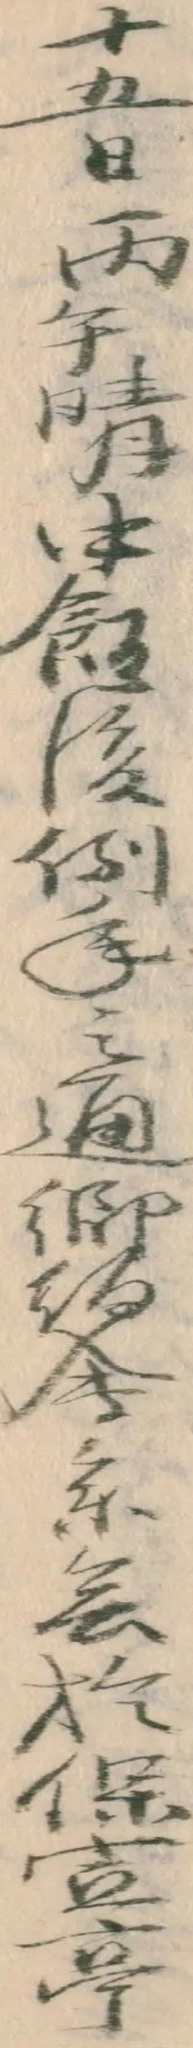十五日丙午晴中飯後例年之通郷約會参集於保宣亭
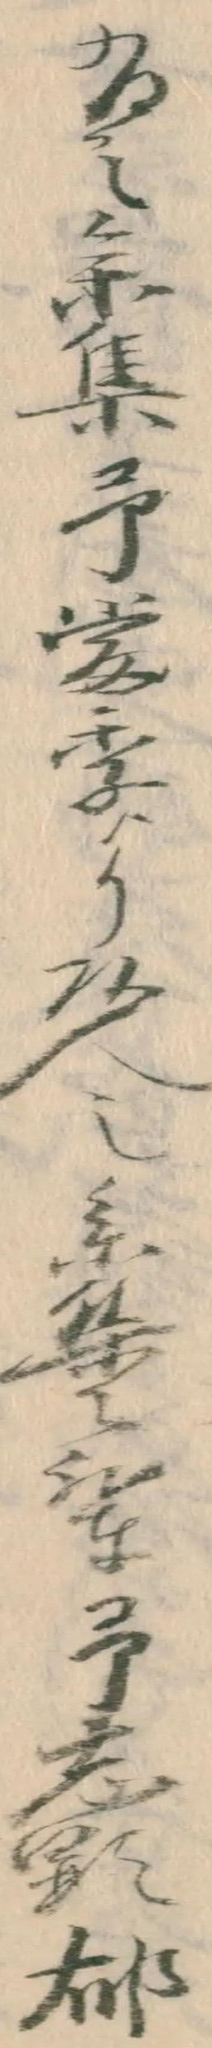有之参集予當季より頭人之参集之輩予志顕郁
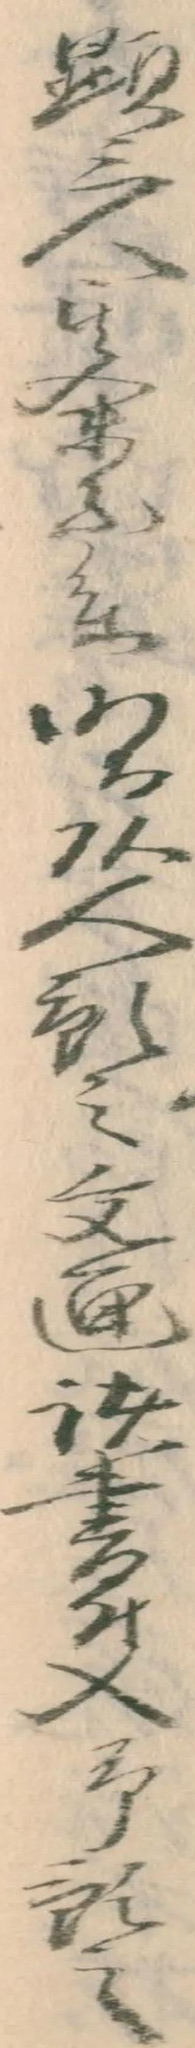顕三人其余不参仍而頭人預之文匣諸書付入予預之
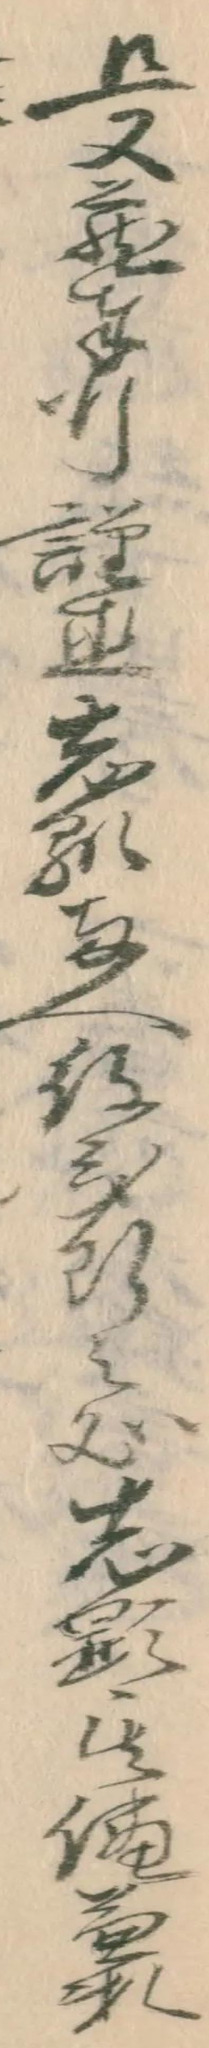且又蔵奉行謹直志顕両人役義断之處志顕其儘兼頼
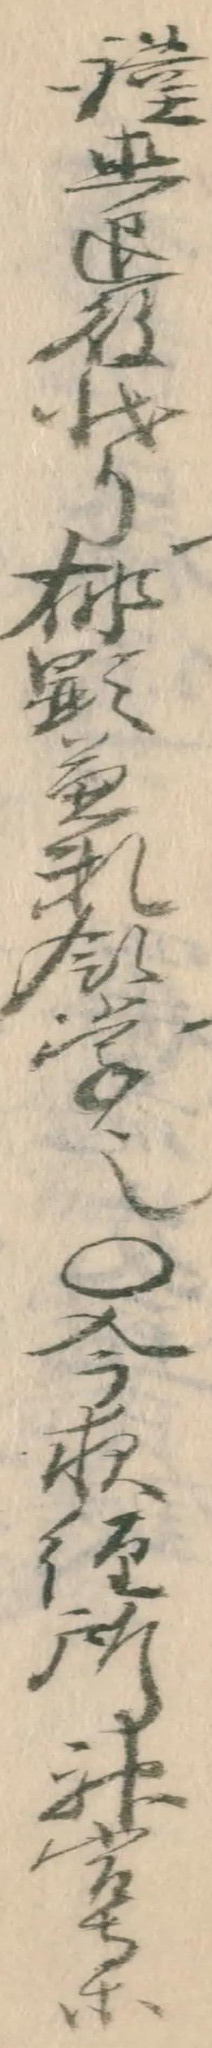謹以退役代り郁顕兼頼領掌也〇今夜経所神宮寺等
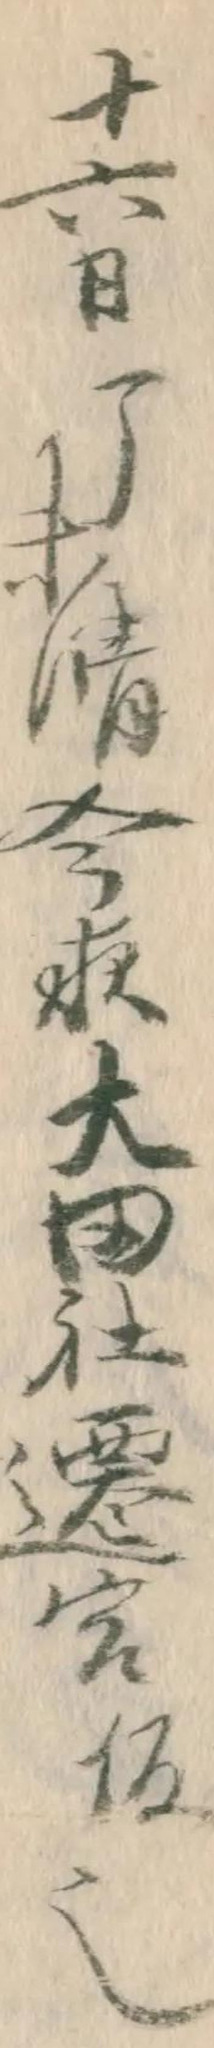十六日丁未晴今夜大田社遷宮仮也
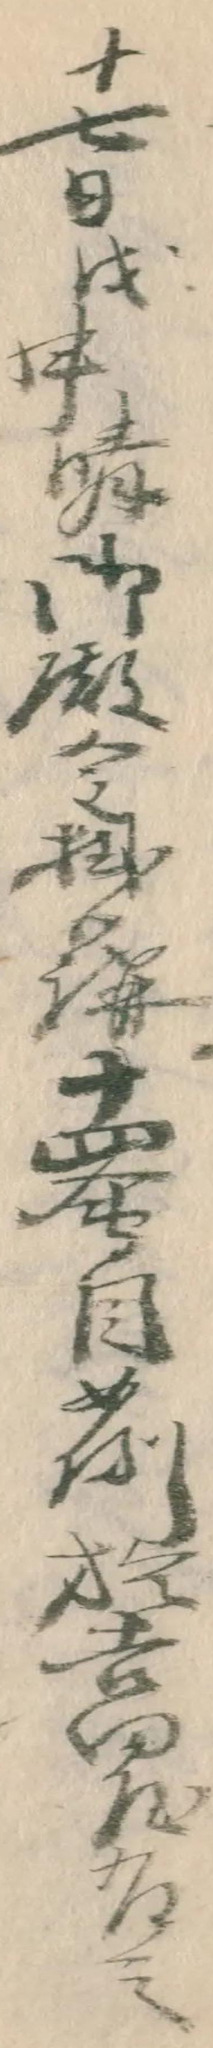十七日戊申晴御殿令掛御講十四會目如例於吉田屋有之
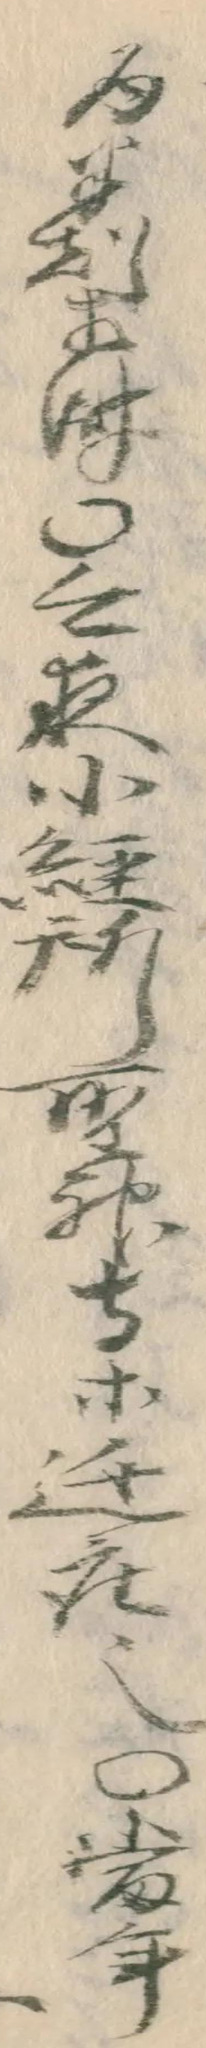酉半刻相済◯今夜小経所聖神寺等遷座也〇當年
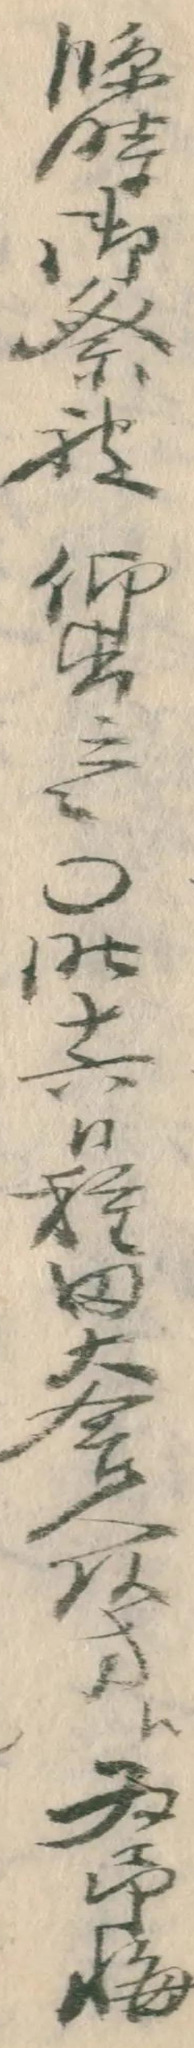臨時御祭被仰出云々○昨十六日種田大舎人頭方え為予悔
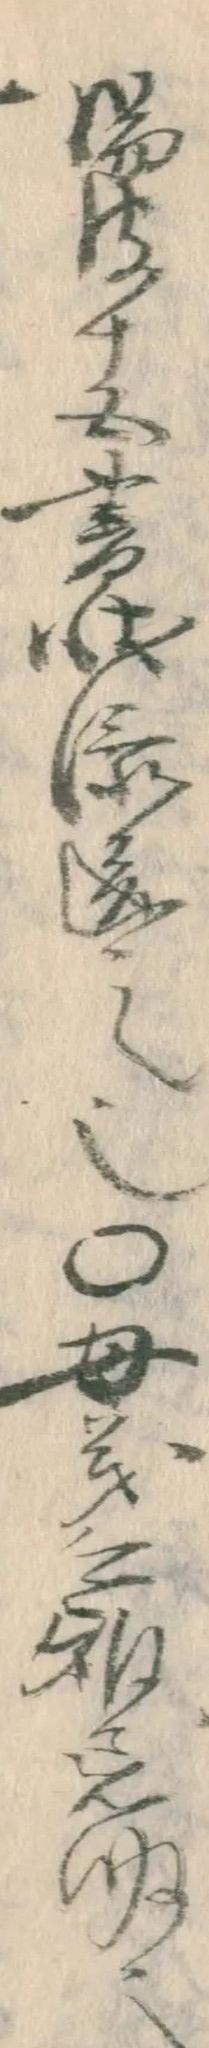陽皮十五書状添送之也○母義今朝忌明也
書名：賀茂社記録. 第66冊
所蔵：国立国会図書館 National Diet Library, JAPAN
